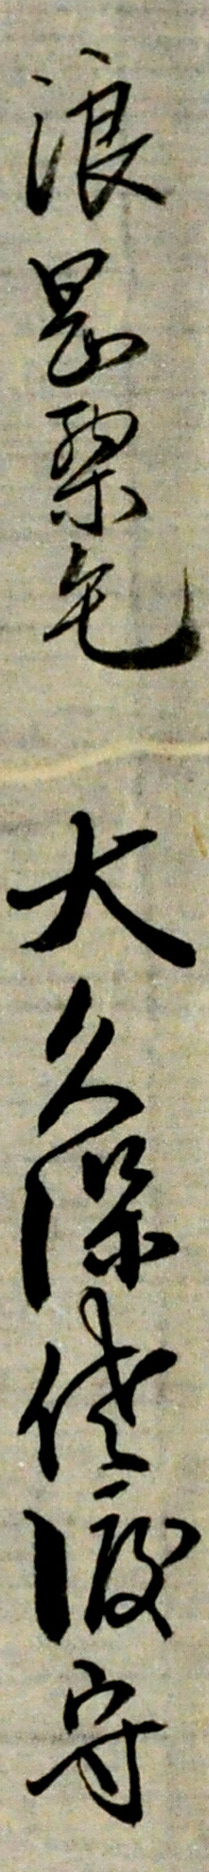浪岡栗毛大久保佐渡守
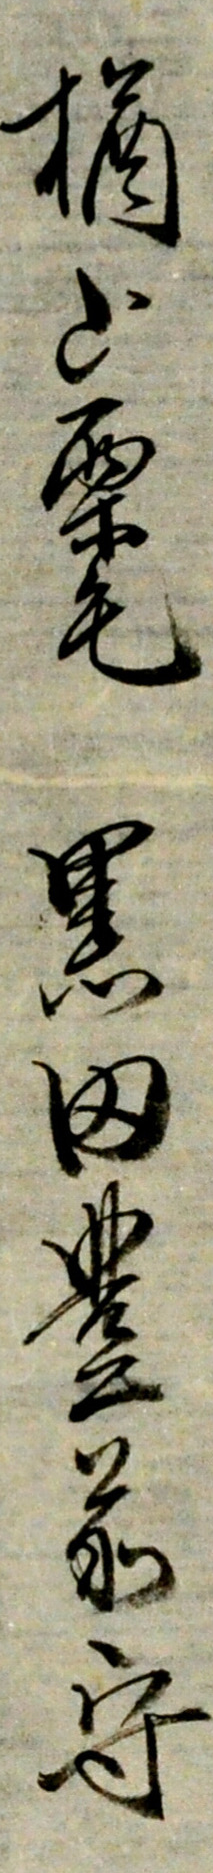猶山栗毛黒田豊前守
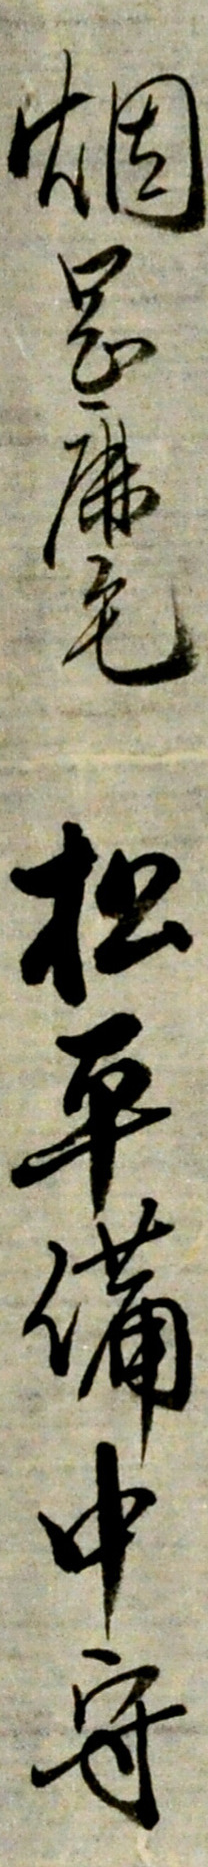烟岡鹿毛松平備中守
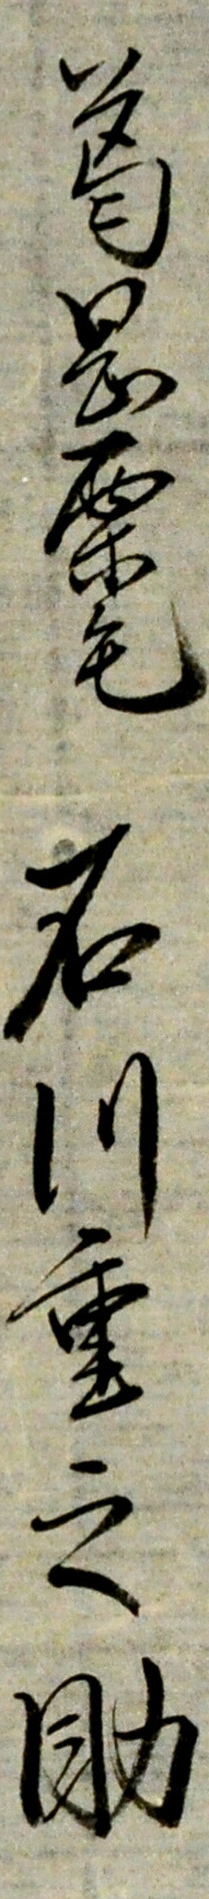葛岡栗毛石川重之助
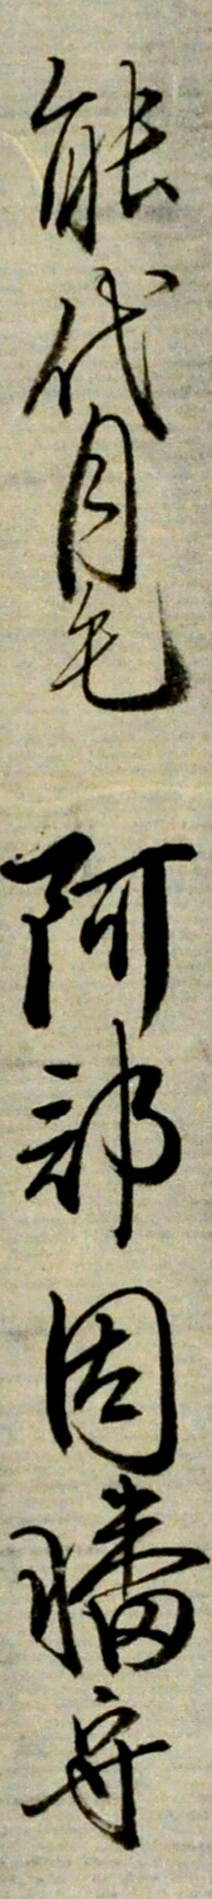能代月毛阿部因幡守
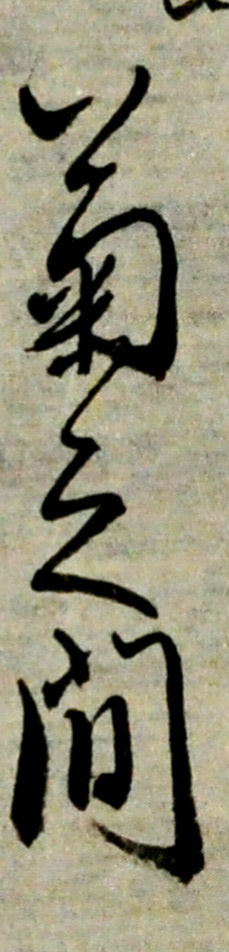菊之間
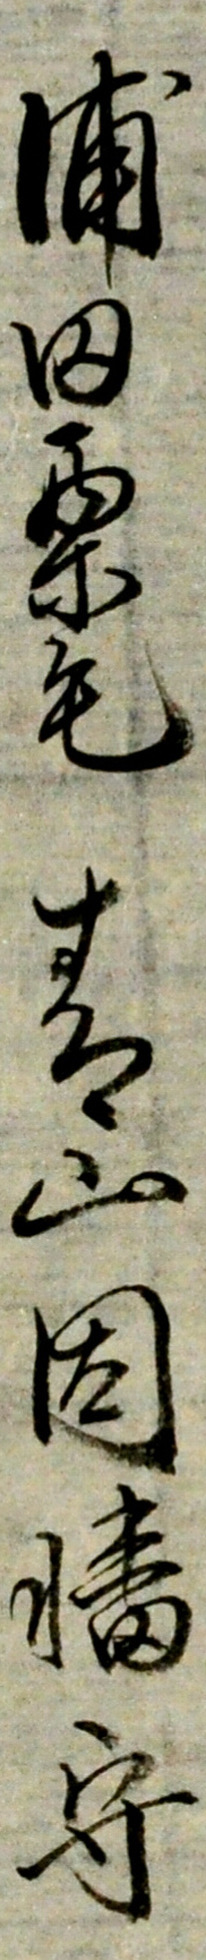浦田栗毛青山因幡守
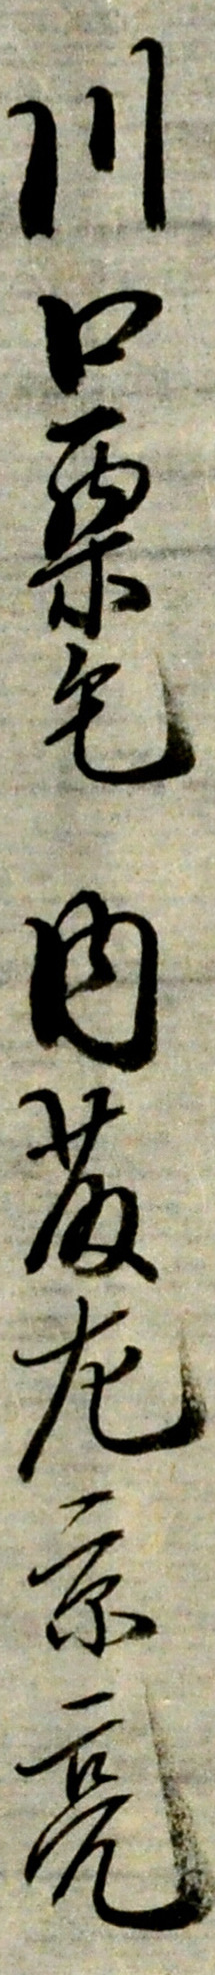川口栗毛内藤左京亮
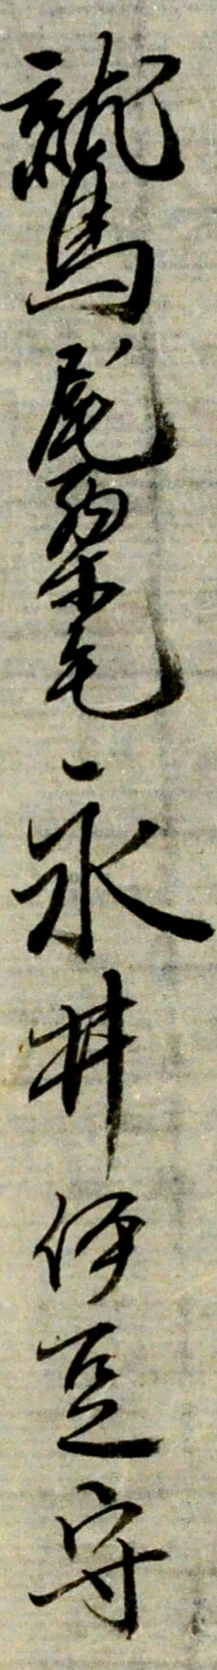鷲ノ尾栗毛永井伊豆守
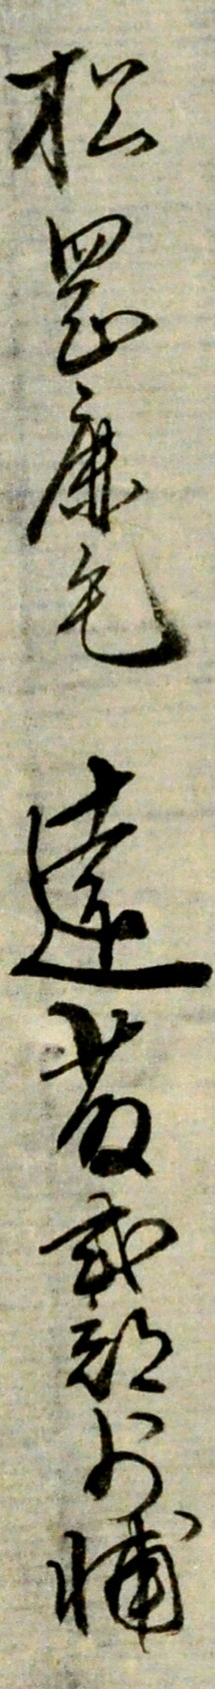松岡鹿毛遠藤式部少輔
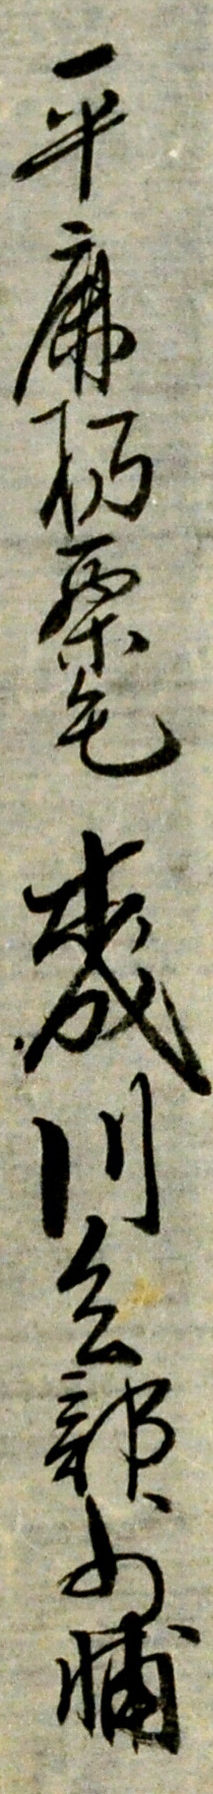平鹿栃栗毛森川兵部少輔

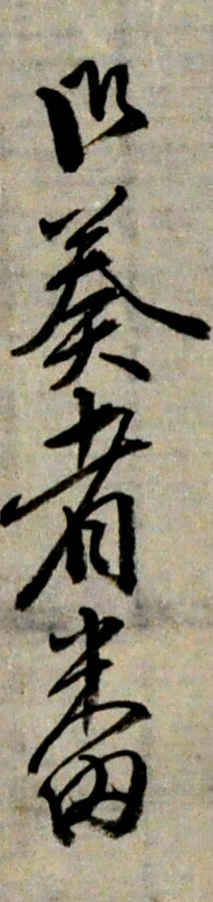御奏者番
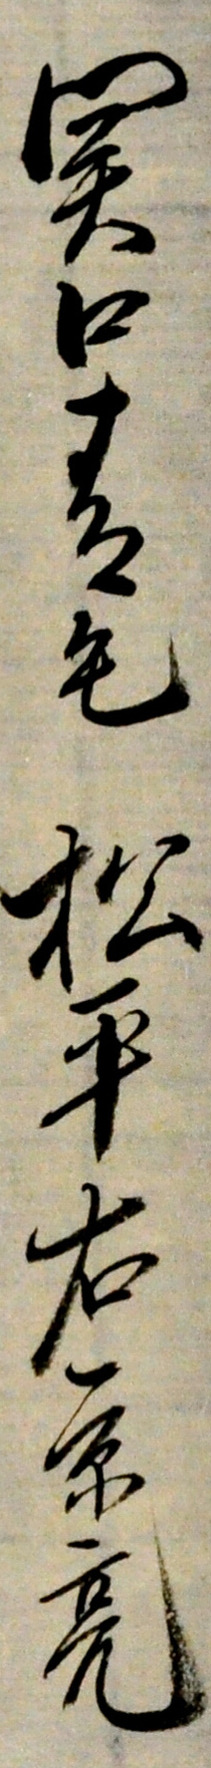関口青毛松平右京亮
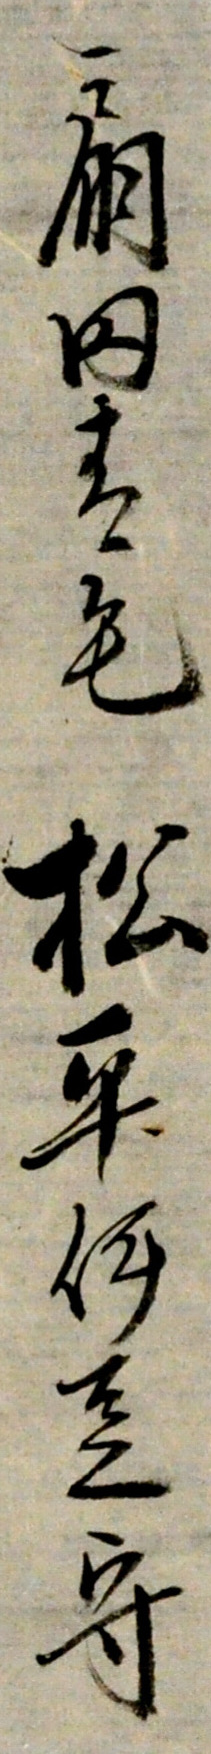扇田青毛松平伊豆守
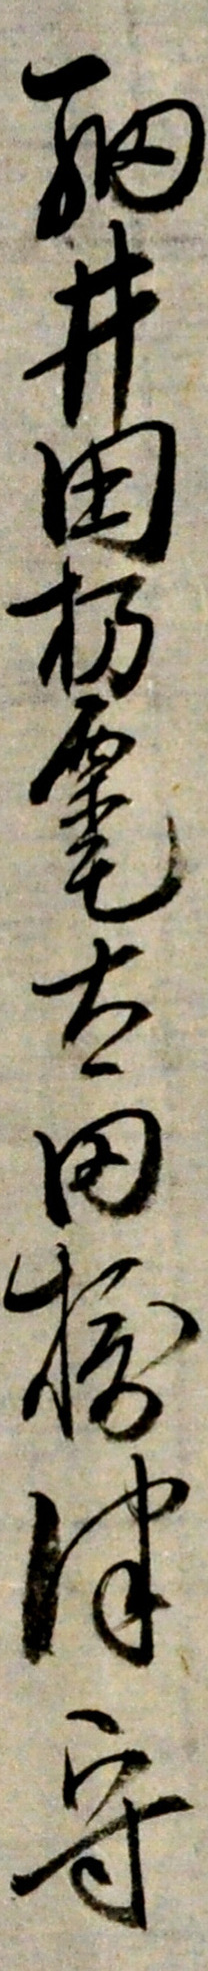細井田栃栗毛太田摂津守
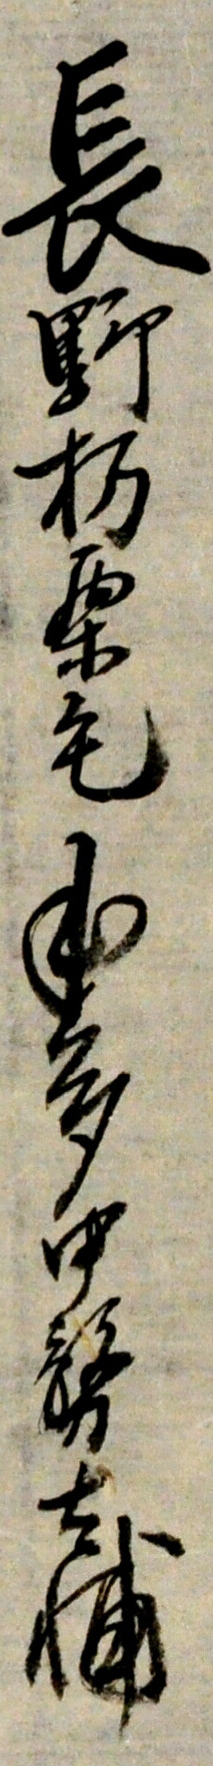長野朽栗毛本多中務太輔
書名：吹上御庭ニ於テ乗馬上覧ノ節留書外
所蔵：伊那市立高遠町図書館・合同会社AMANE
